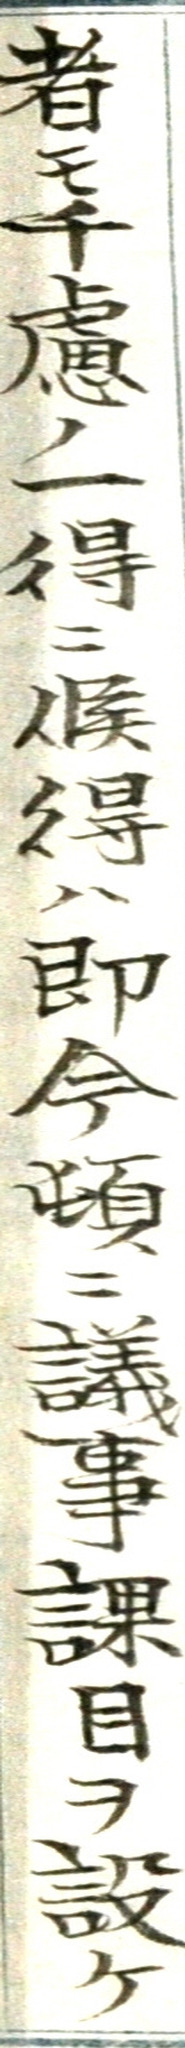者モ千慮ノ一得ニ候得ハ即今頃ニ議事課目ヲ設ケ

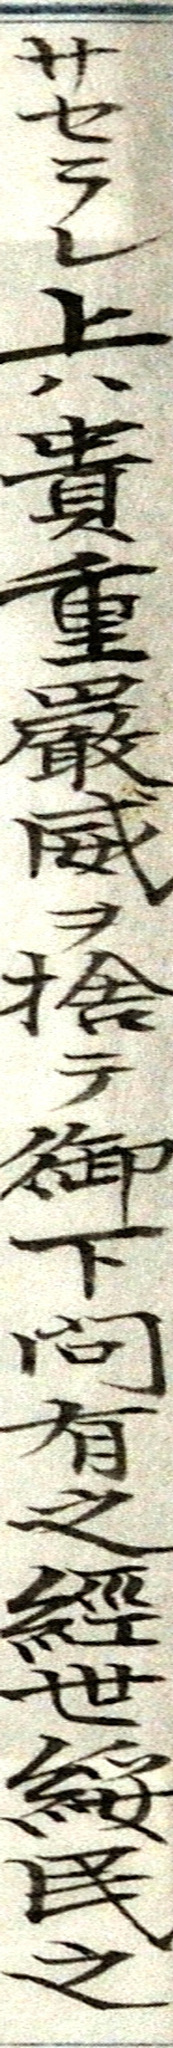サセラレ上ハ貴重厳威ヲ捨テ御下問有之経世綏民之
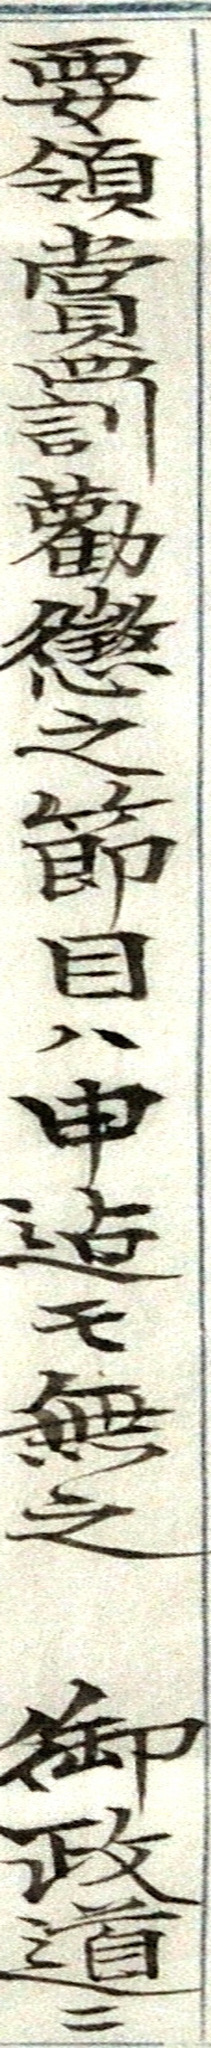要領賞罰勧懲之節目ハ申迄モ無之御政道ニ
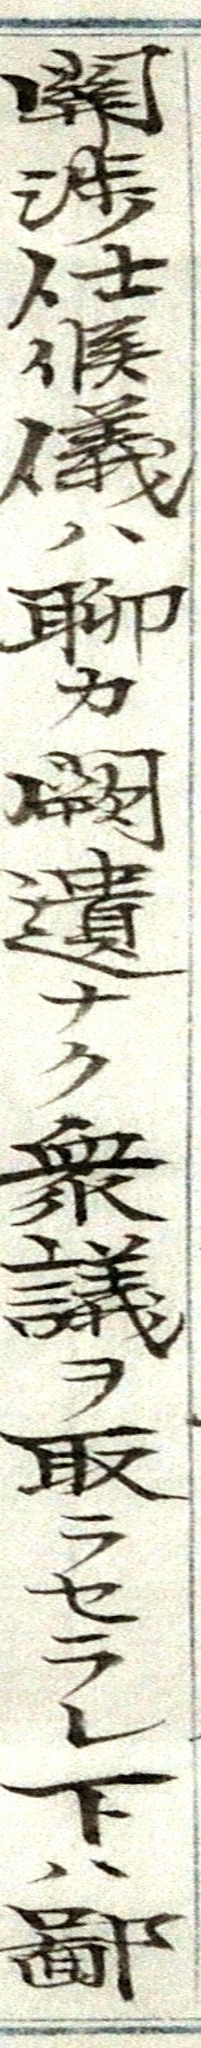関渉仕候儀ハ聊カ欠遺ナク衆議ヲ取ラセラレ下ハ鄙
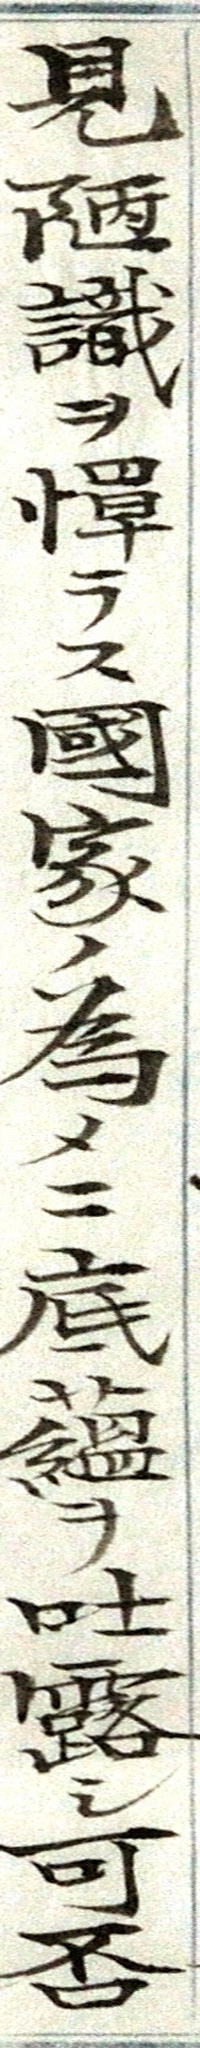見陋識ヲ憚ラス国家ノ為メニ底蘊ヲ吐露シ可否
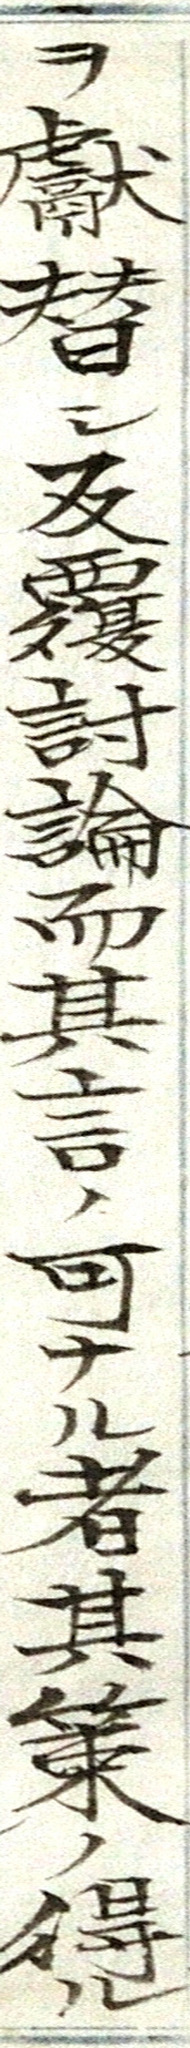ヲ献替シ及覆討論而其言ノ可ナル者其策ノ得ル
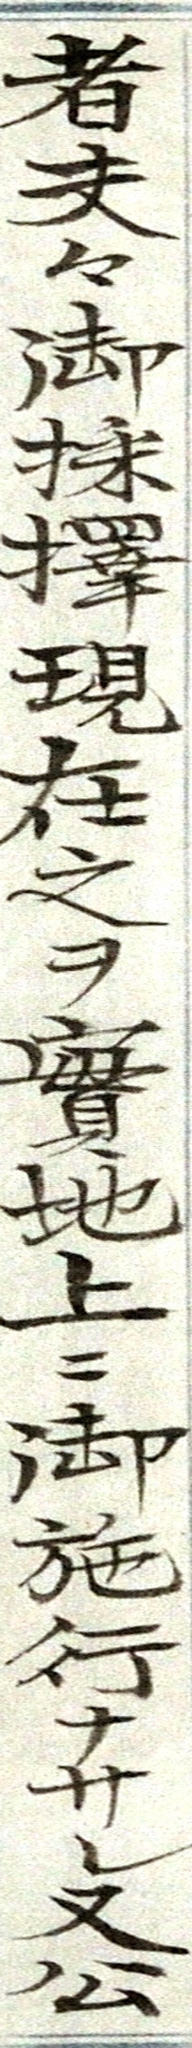者夫々御採択現在之ヲ実地上ニ御施行ナサレ亦公
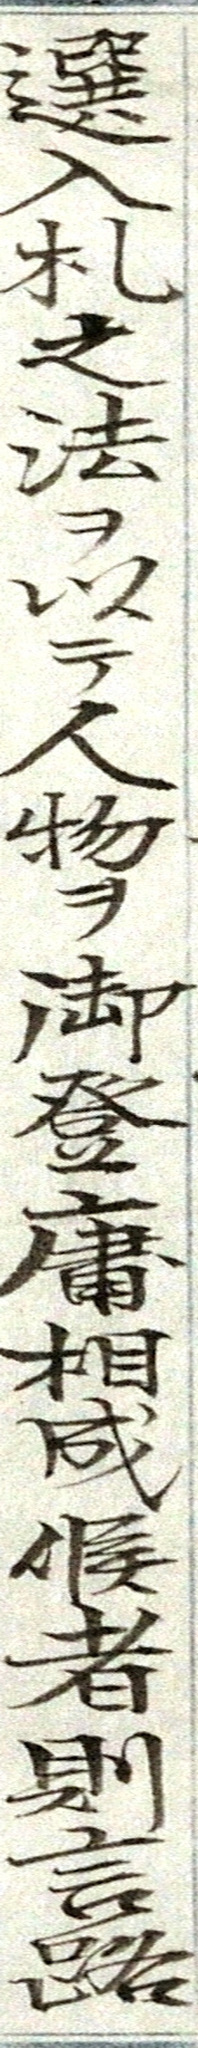選入札之法ヲ以テ人物ヲ御登庸相成候者則言路
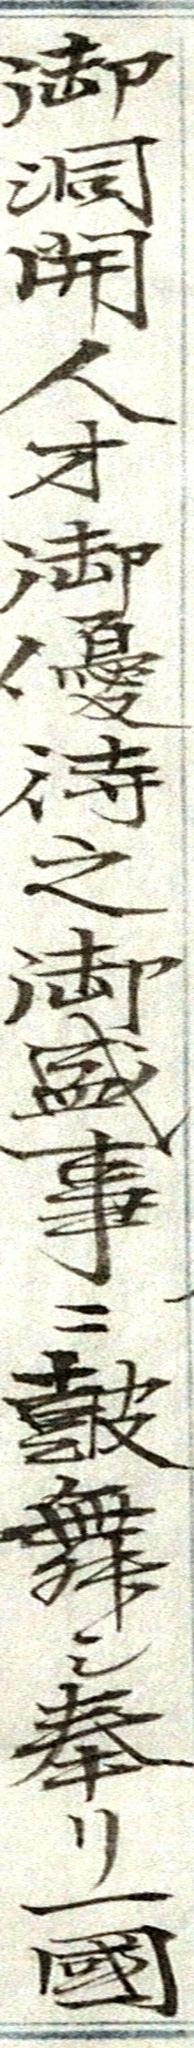御洞開人才御優待之御盛事ニ皷舞シ奉リ一国
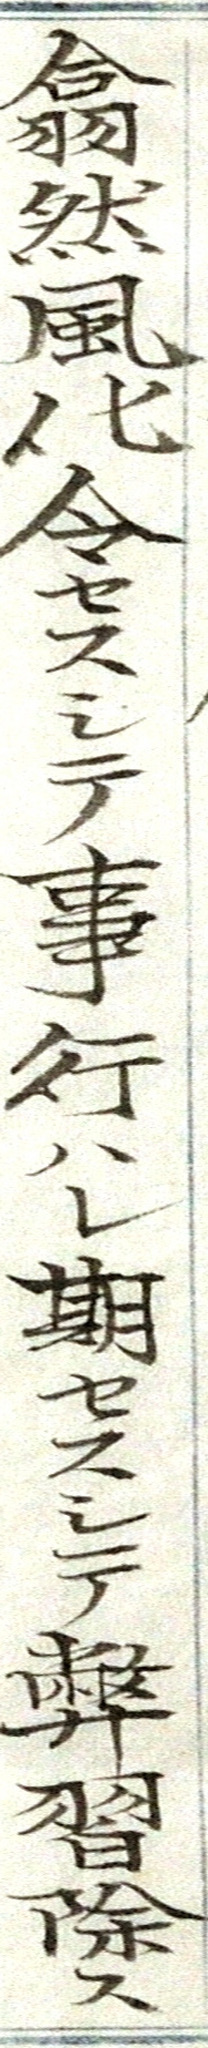翕然風化令セスシテ事行ハレ期セスシテ弊習除ス
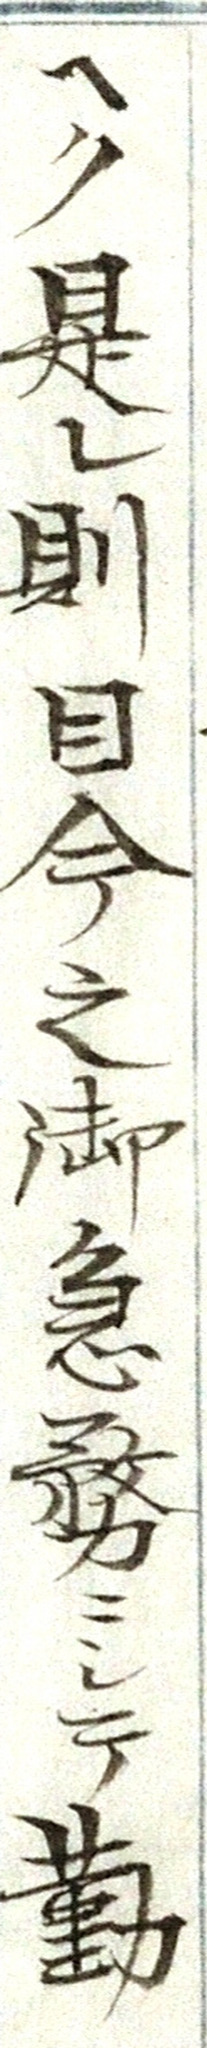ヘク是レ則目今之御急務ニシテ勤
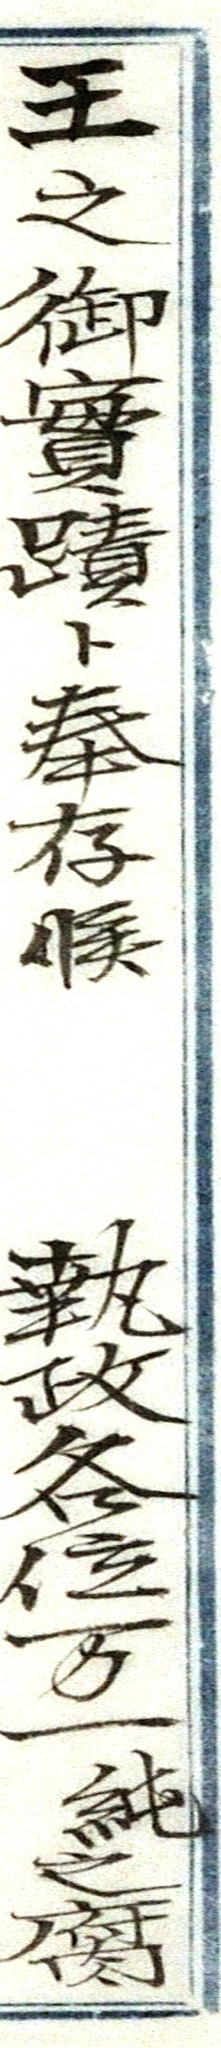王之御実蹟ト奉存候執政各位万一純之腐
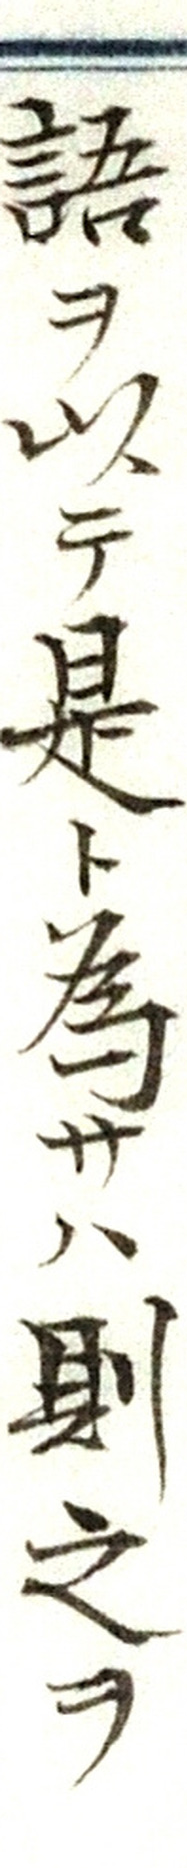語ヲ以テ是ト為サハ則之ヲ
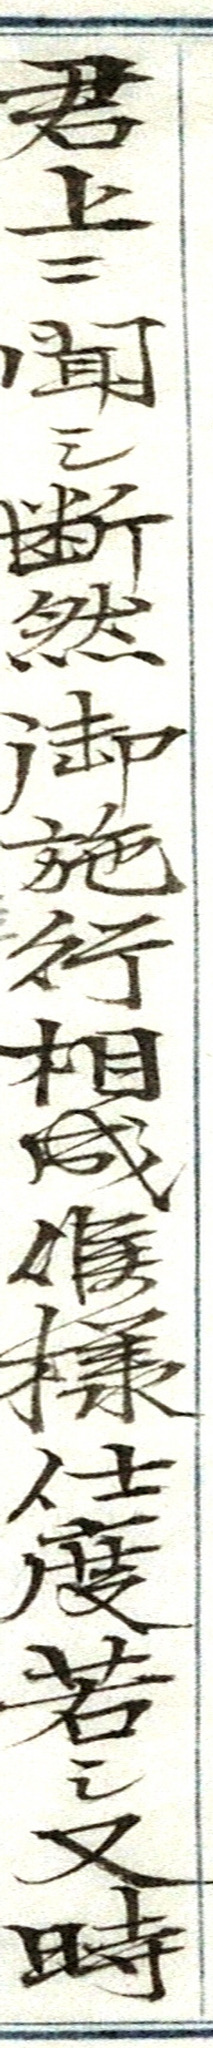君上ニ聞シ断然御施行相成候様仕度若シ又時
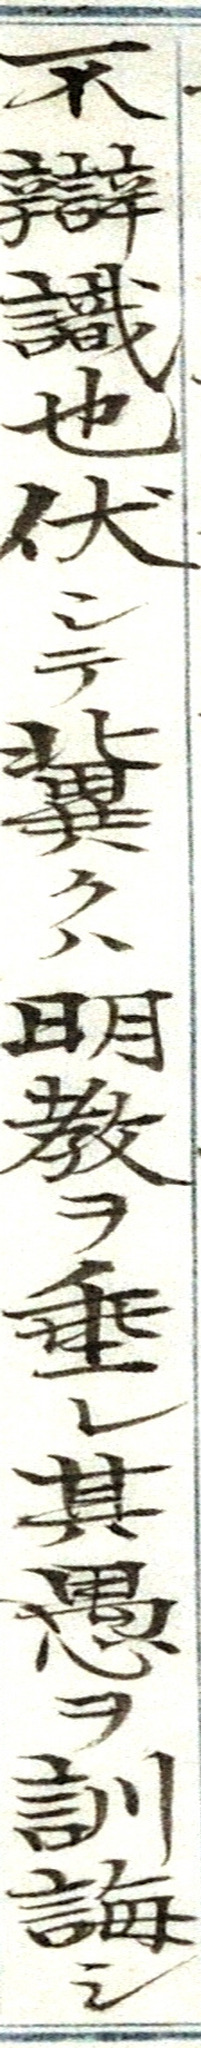不辨識也伏シテ冀クハ明教ヲ垂レ其愚ヲ訓誨シ
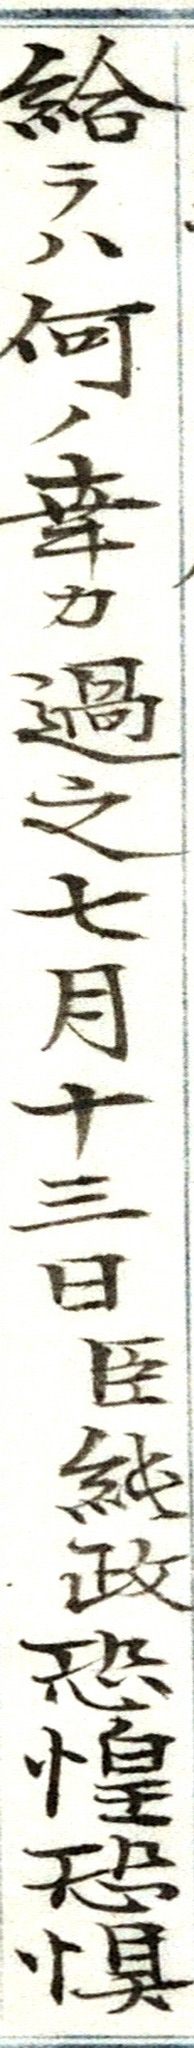給ラハ何ノ幸カ過之七月十三日臣純政恐惶恐惧
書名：高遠藩執政ニ提出セシ建議書
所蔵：伊那市立高遠町図書館・合同会社AMANE
